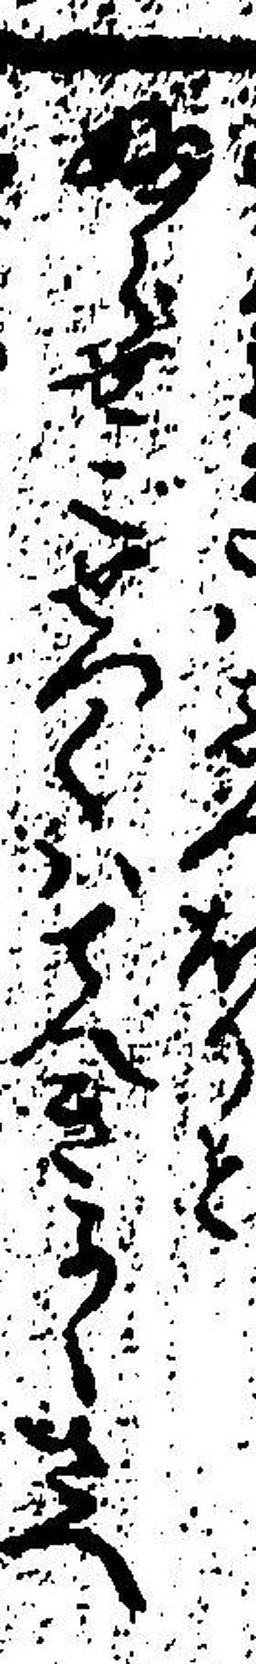ぬらせごせつくはてんきよくさへ
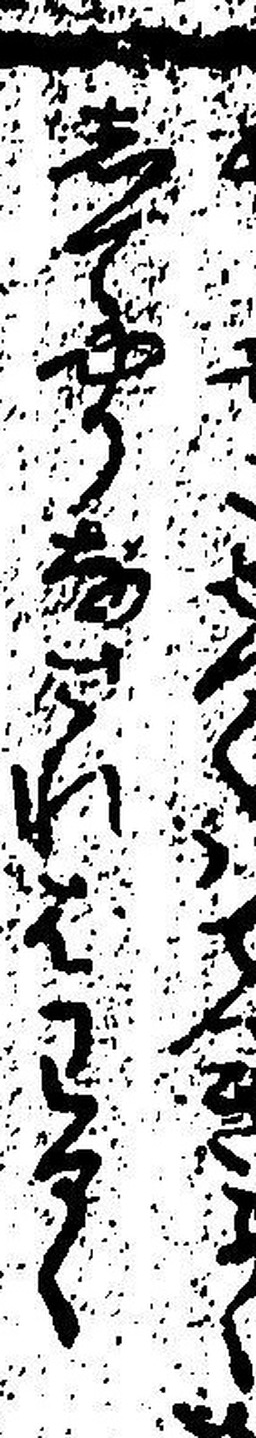してやりなされはわるく
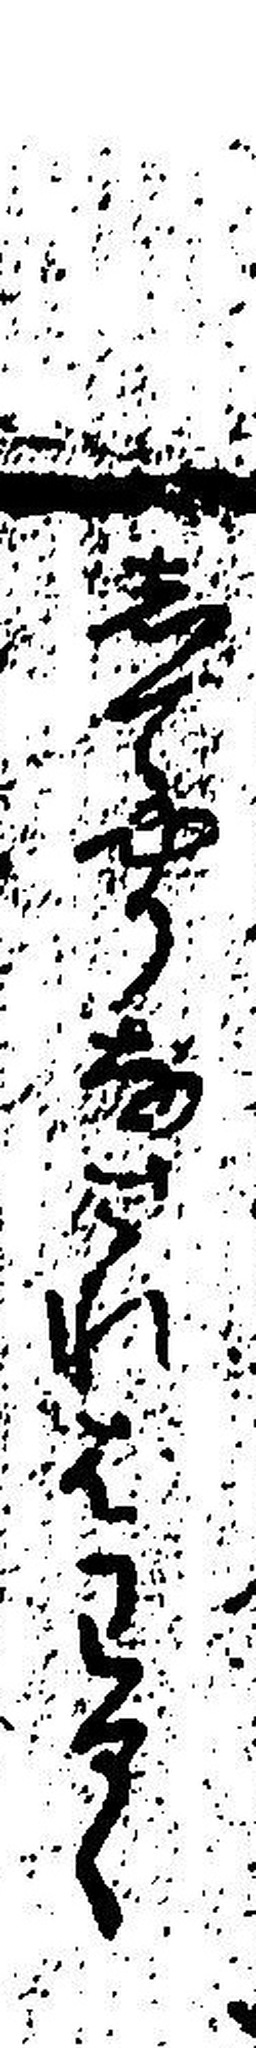してやりなされはわるく
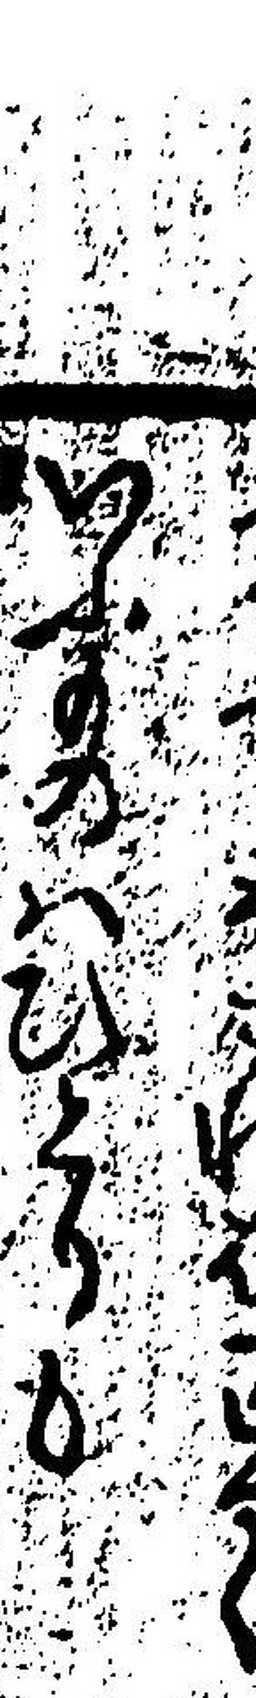いふものはひとりも
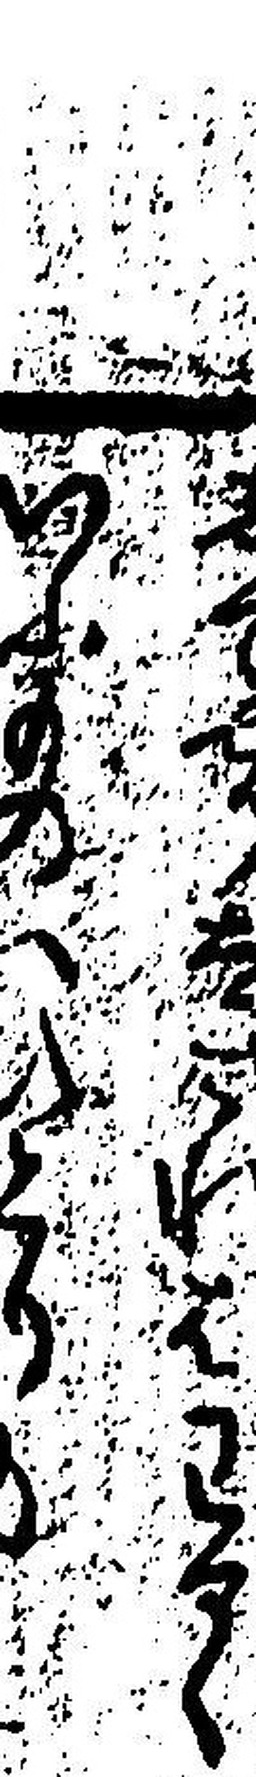いふものはひとりも
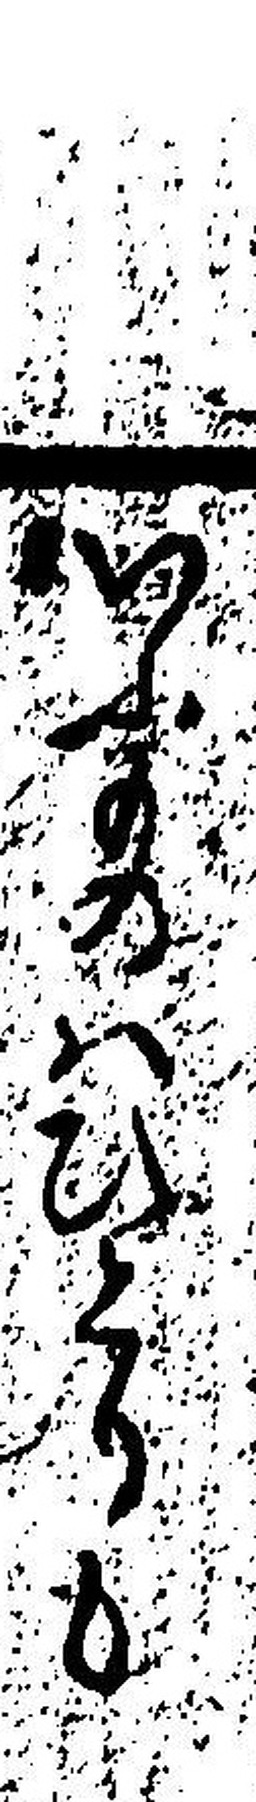いふものはひとりも
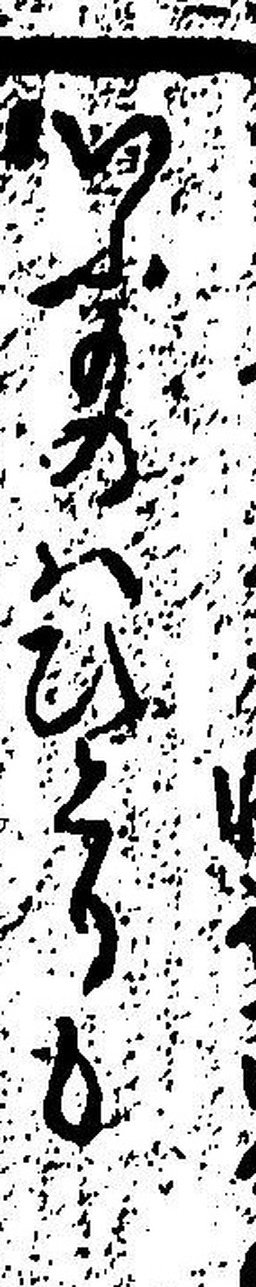いふものはひとりも
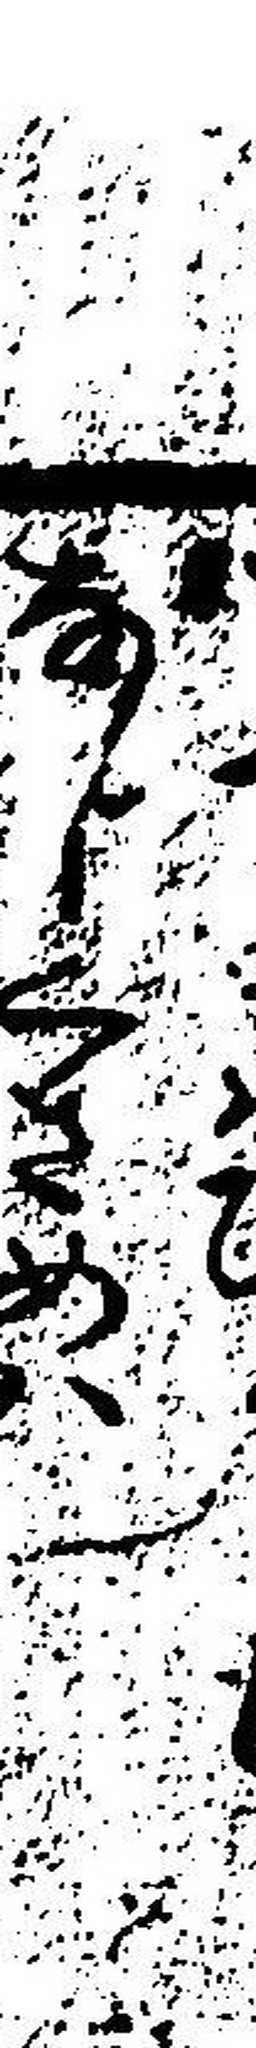なしくさめは
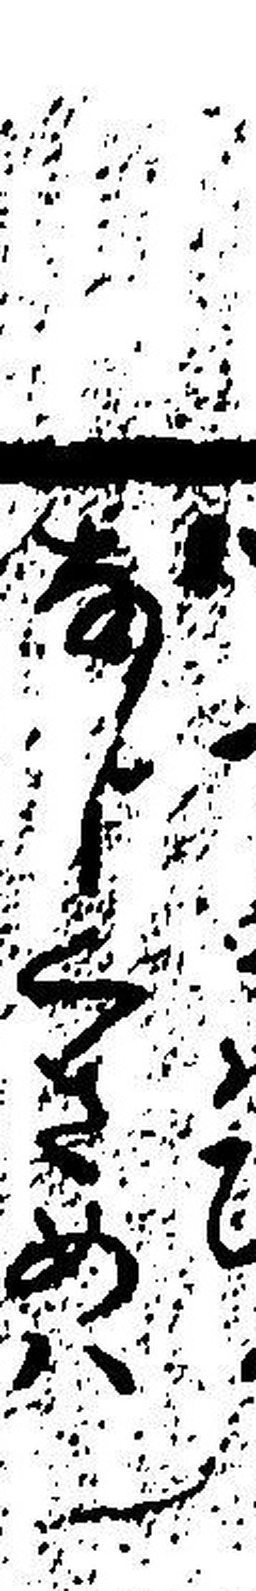なしくさめは
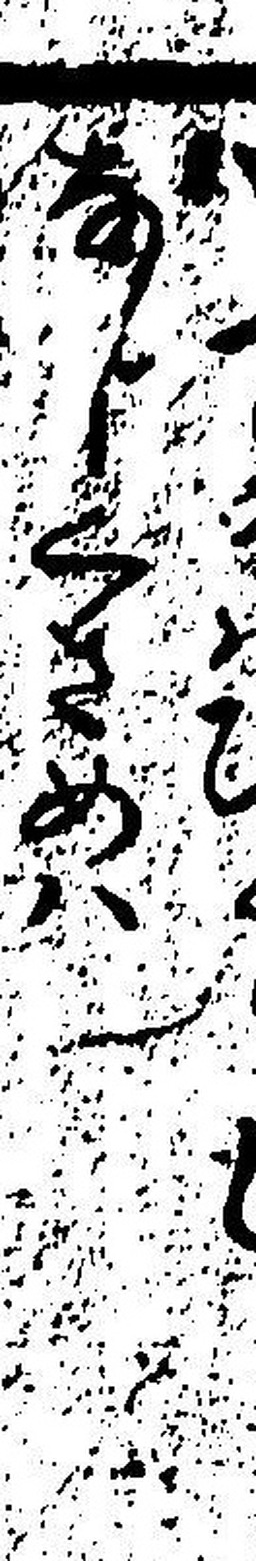なしくさめは
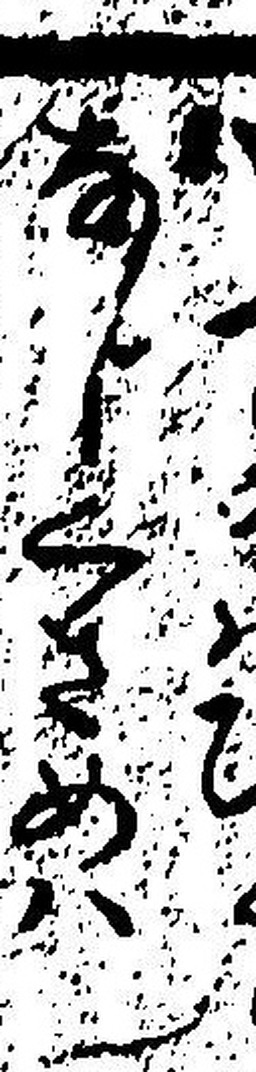なしくさめは
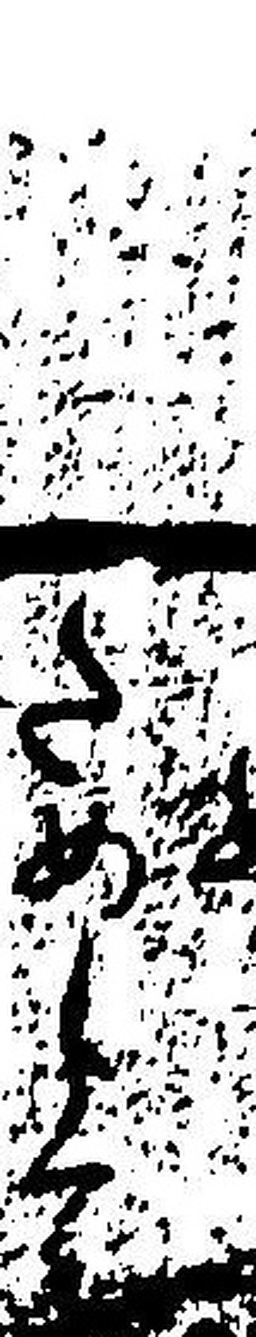ためして
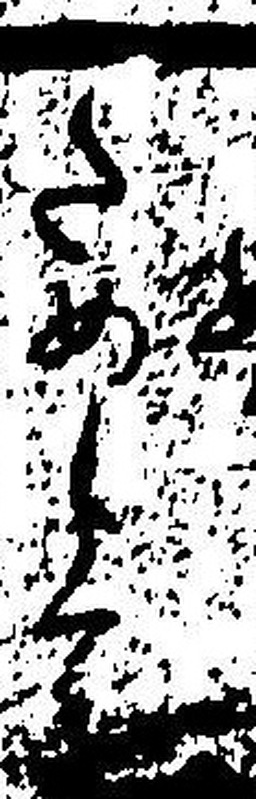ためして
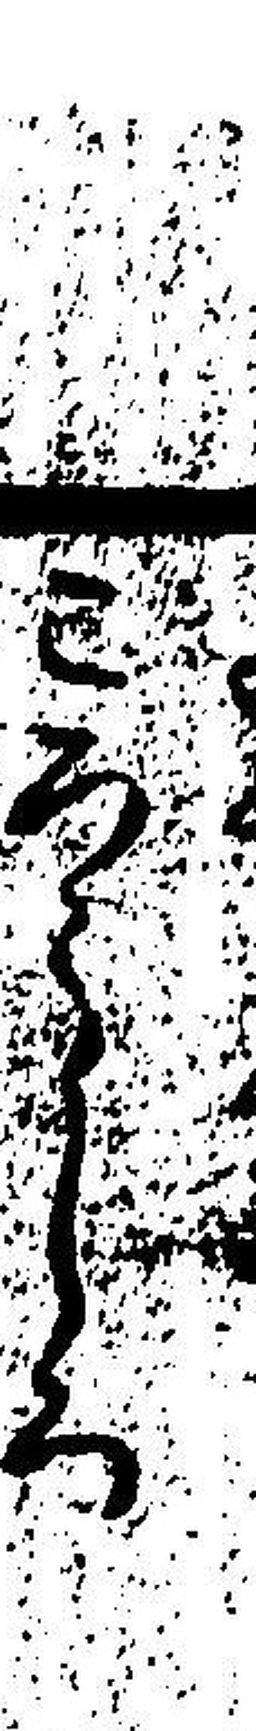ころうしろ
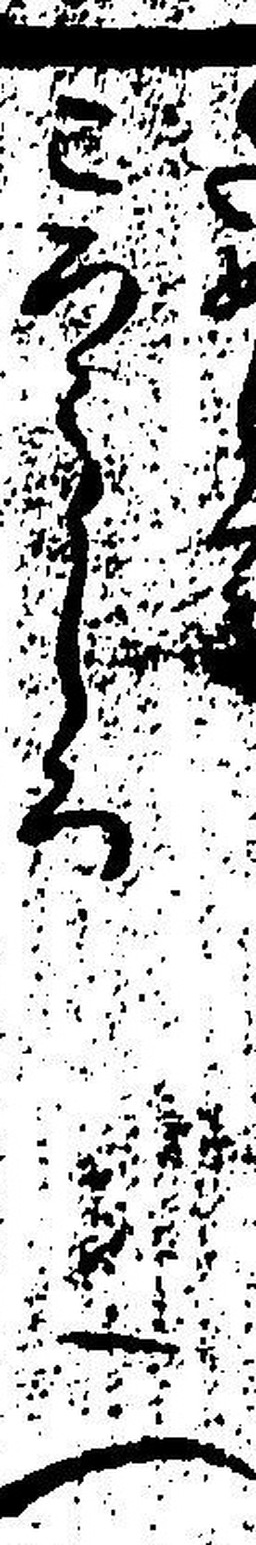ころうしろ
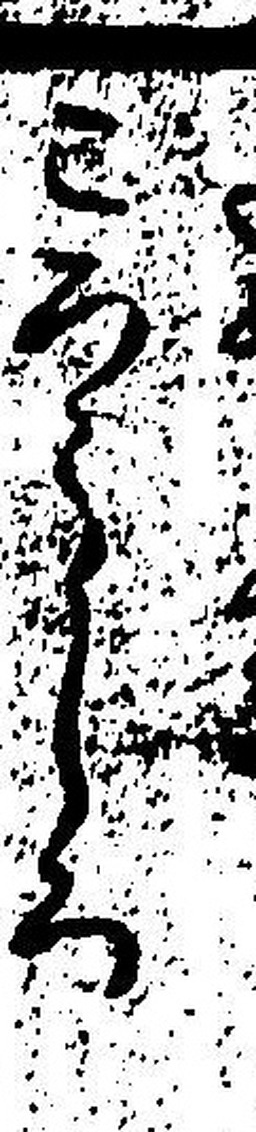ころうしろ
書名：牡丹餅棚有 / 市場通笑作
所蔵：東京大学総合図書館 General Library in the University of Tokyo, JAPAN
